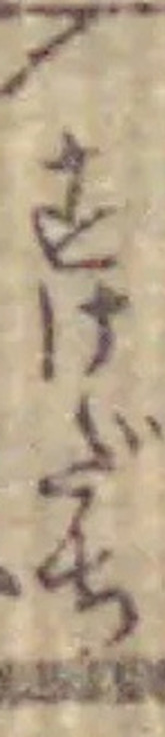すけだち
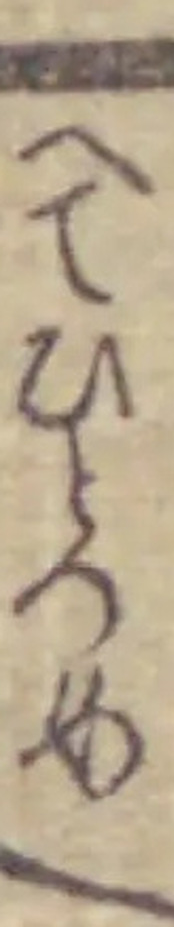へてひとつめ
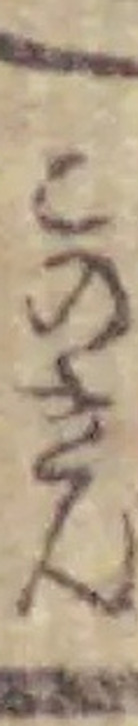このきん
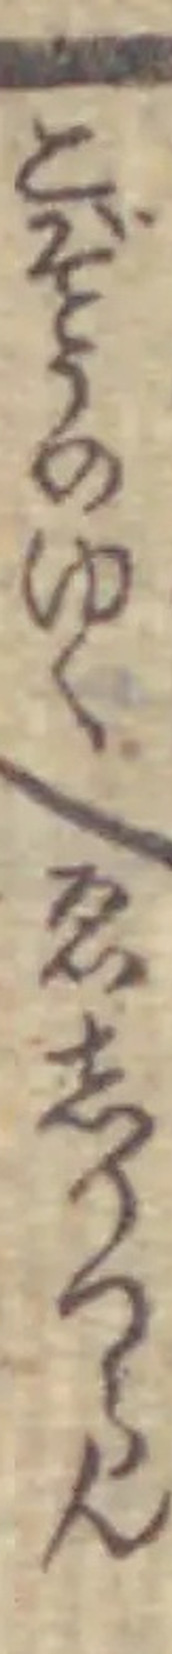こぞうのゆくゑしりつらん
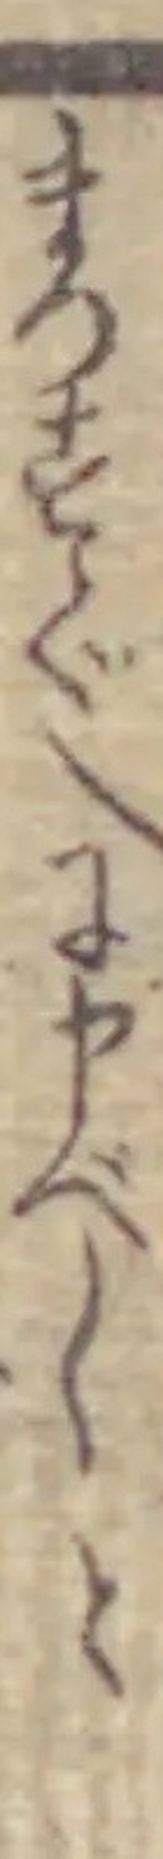まつすぐに申べしと
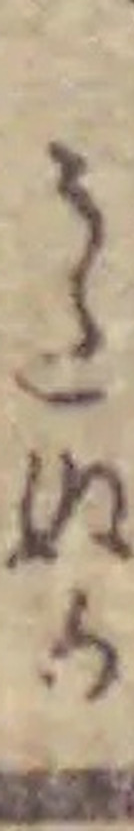うたぬか
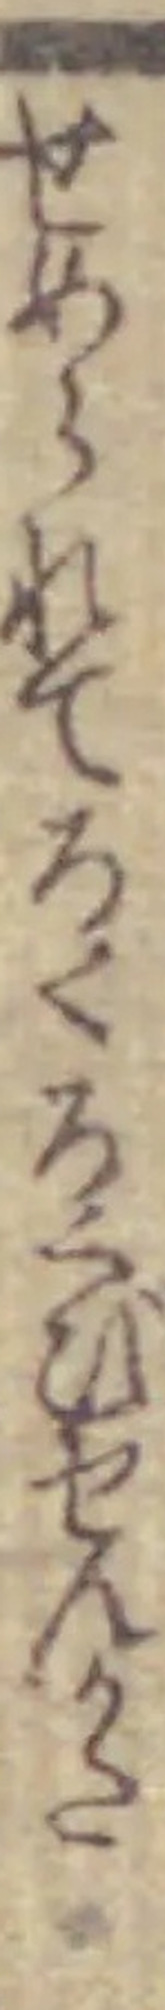せめられてろくろくびせんかた
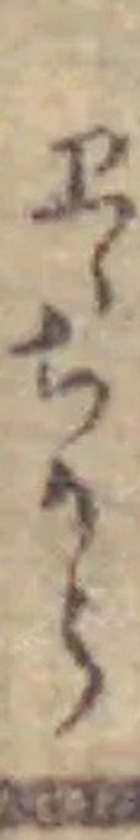ヱヽちから
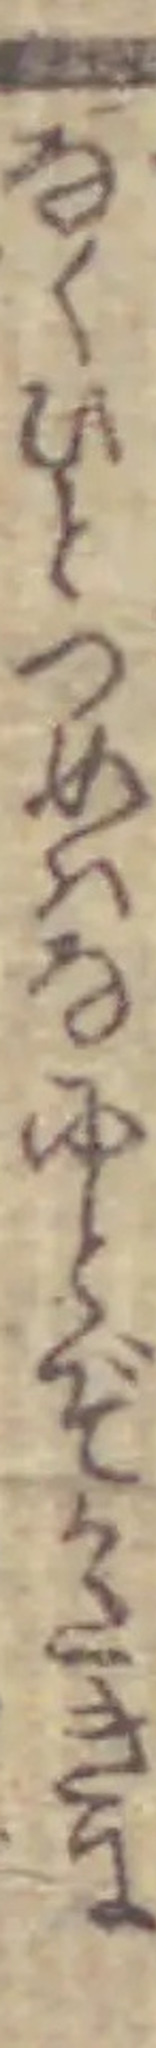なくひとつめはなにとぞかたきに
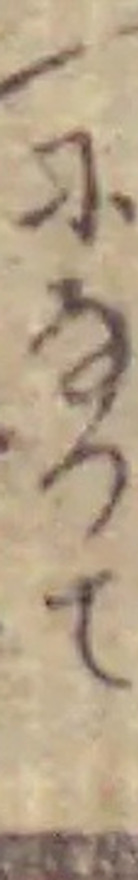になつて
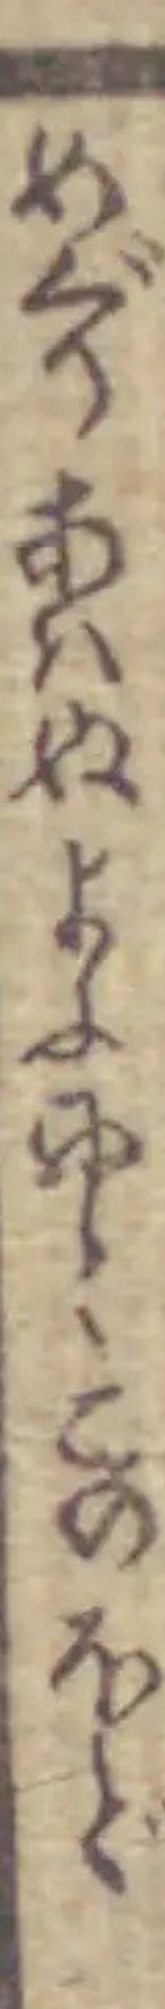めぐりあはぬよふにとこのほど
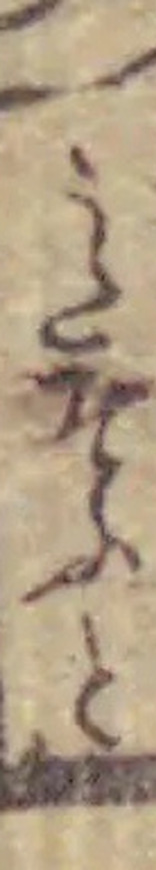うたそふと
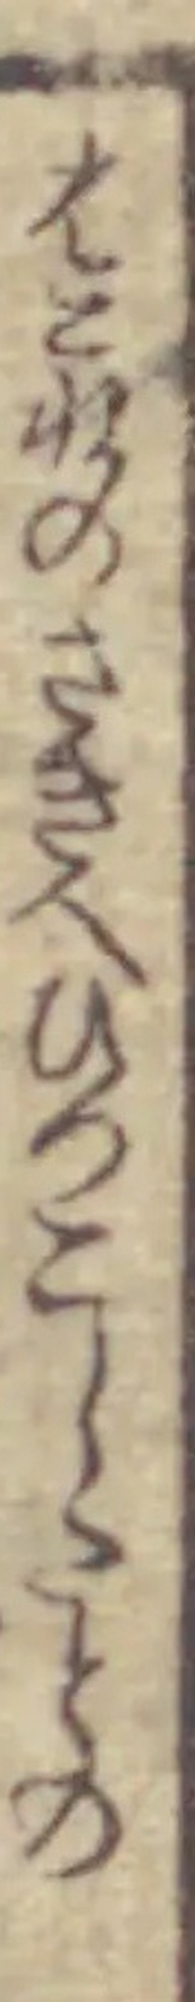はこねのさきへひつこしたとの
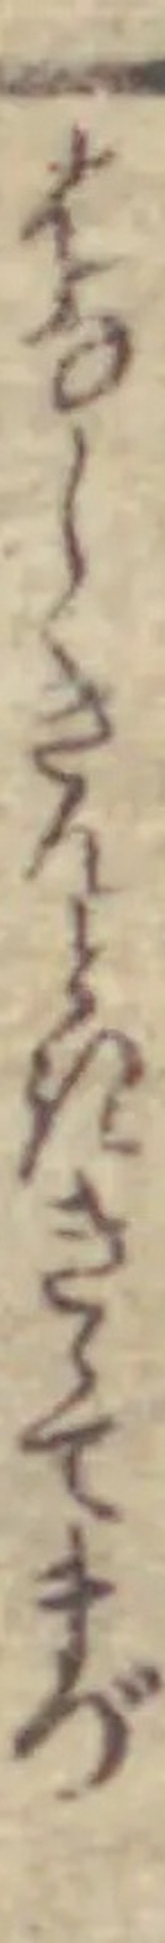はなしきんとききゝてまづ
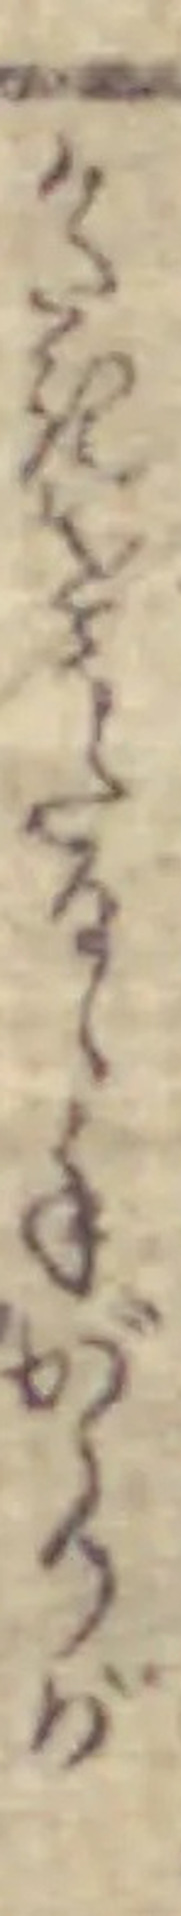かたきをうたるゝ手がゝりが
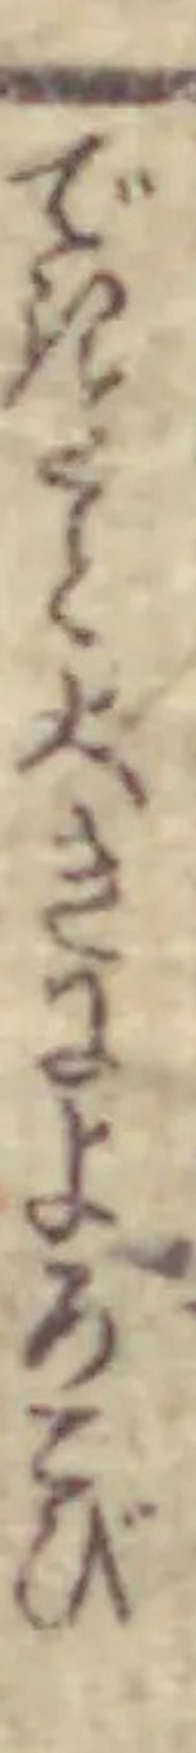できたと大きによろこび
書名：化物敵討 2巻
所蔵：国立国会図書館 National Diet Library, JAPAN
